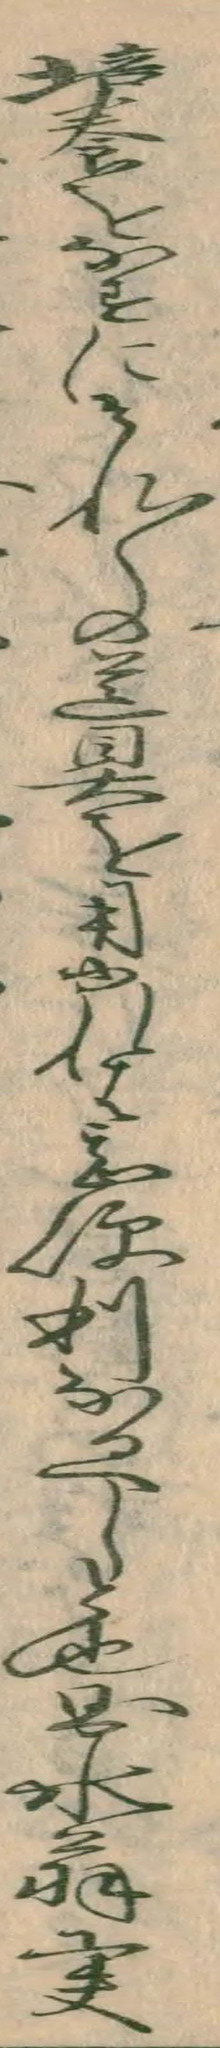○培養をなすにそれ〳〵の道具を用ゆれは悉甚便利なるへしと也則水翁工夫
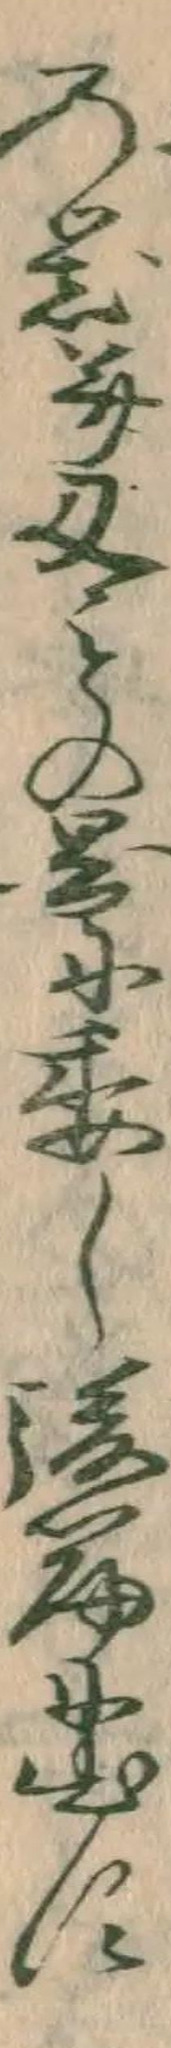の器并刃もの図に委し後編篇に出す
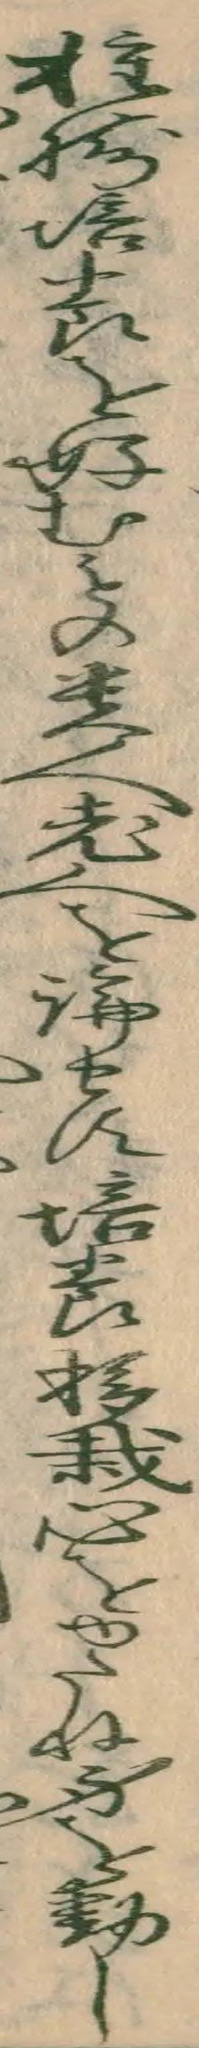○種樹培養を好むもの貴人老人を論せす培養移栽心をゆたね身を勤動し
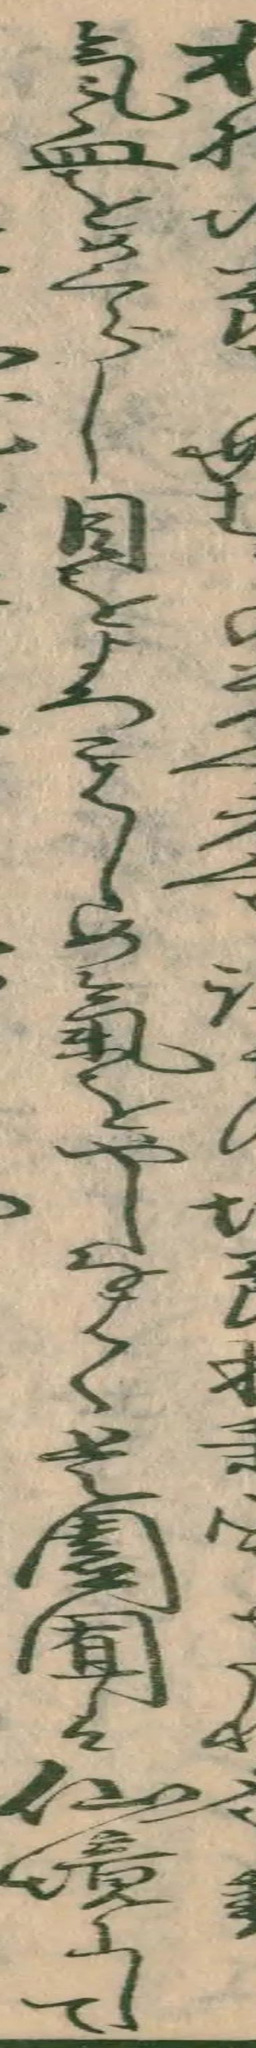気血をめくらし目をよろこはしめ気をやしなはゝ其是園囿は仙境にして
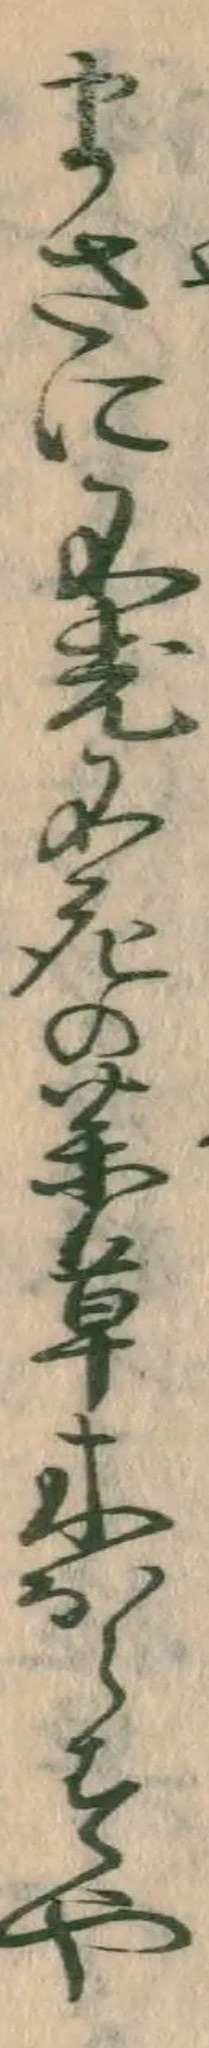まさに不老不死の薬草木ならすや
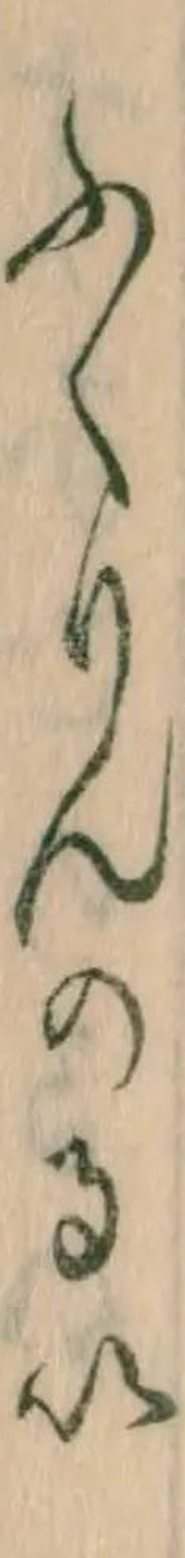ふくりんのるい
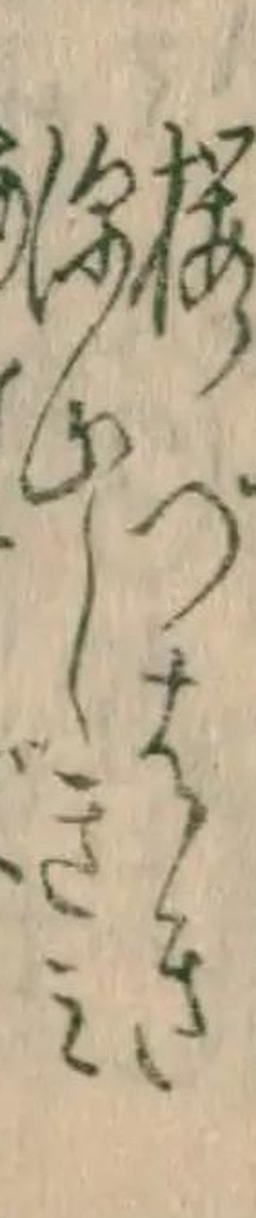窪左しきみ
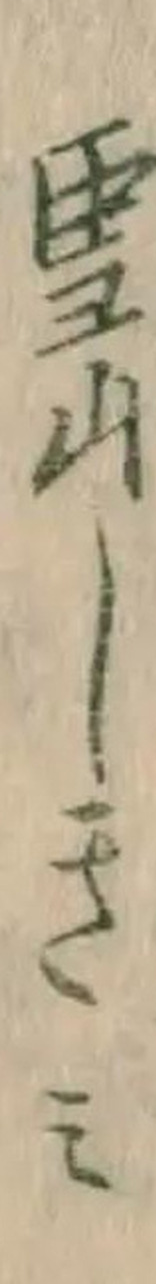永島雪山しきみ
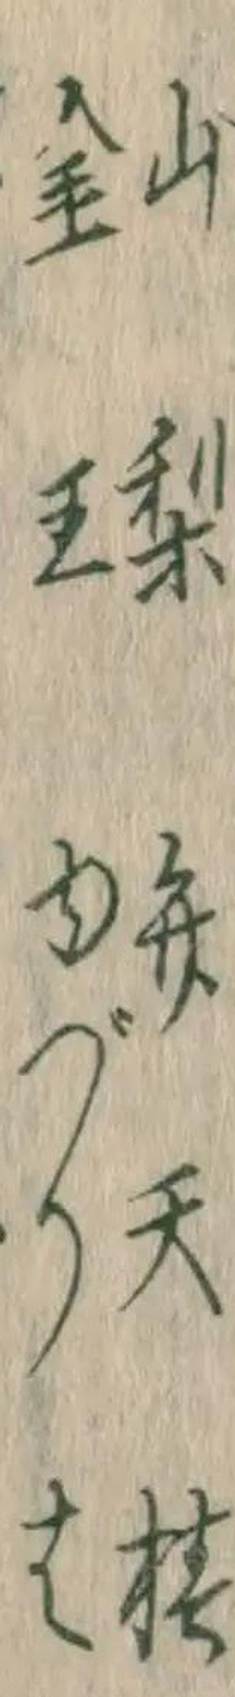金王ゆづりは
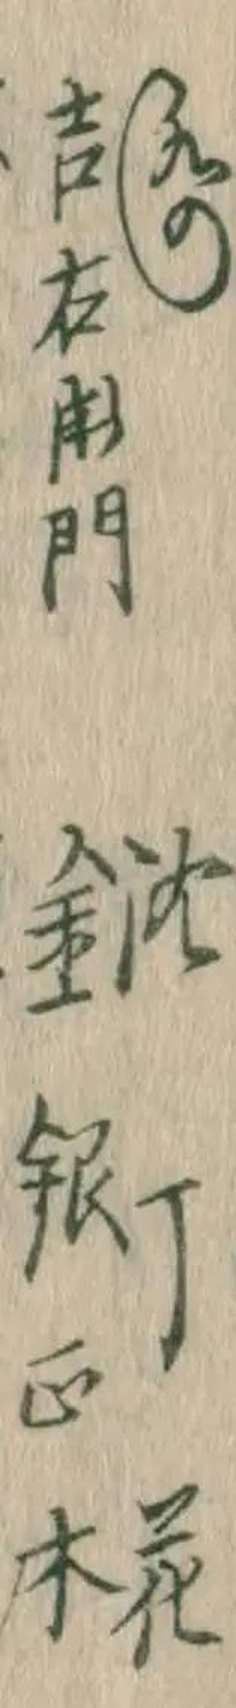吉右衛門金銀正木
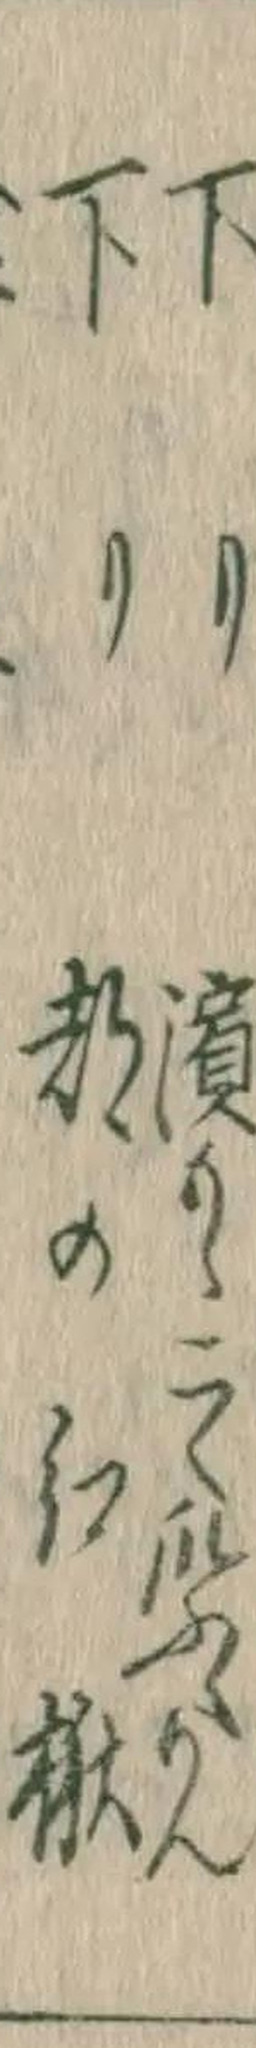下り都の紅楸
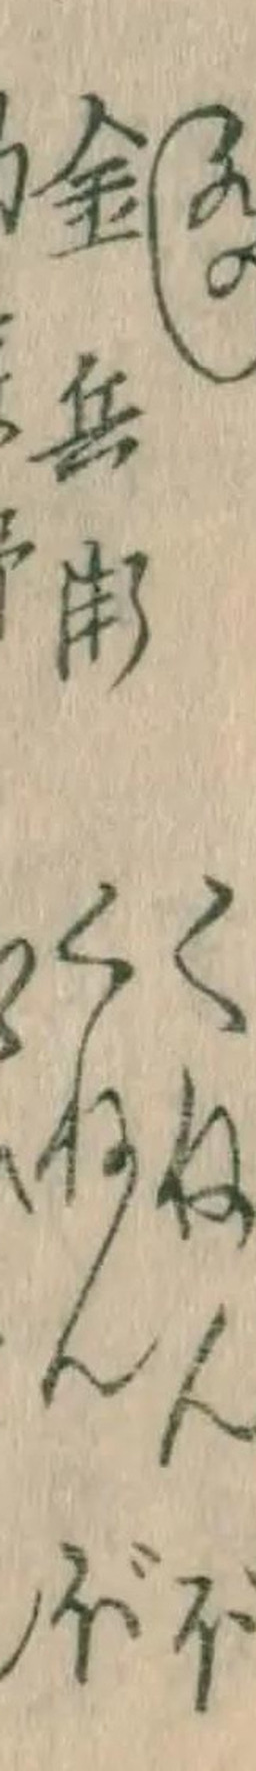金兵衛くねんぼ
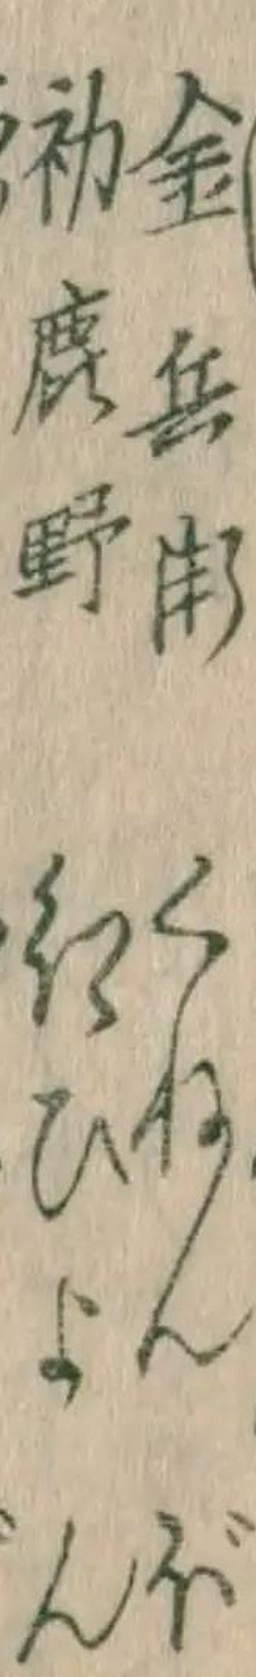初鹿野紅ひよん
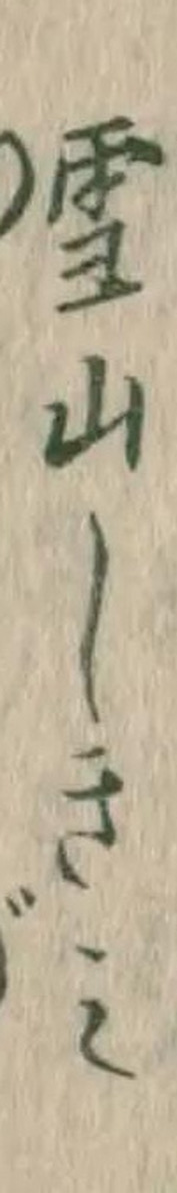永島雪山しきみ

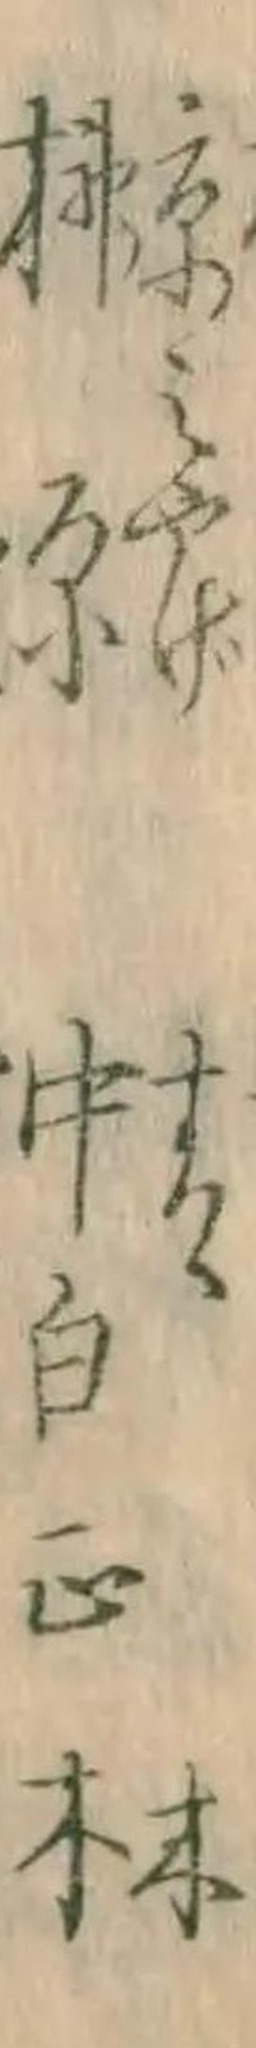榊原中白正木
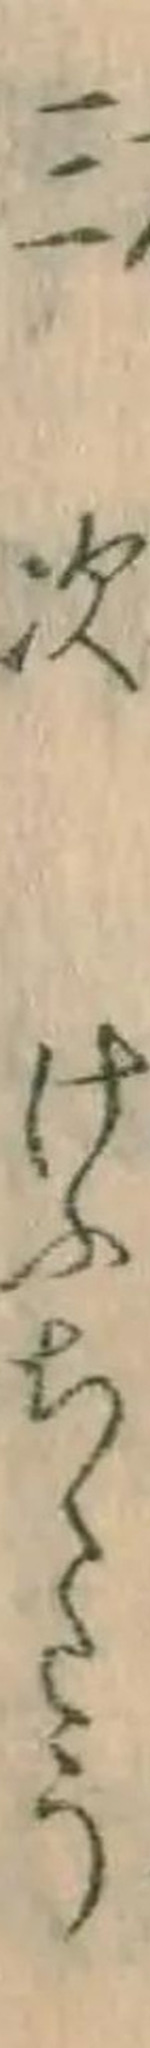三次けふちくたう
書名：草木奇品家雅見 3巻. [3]
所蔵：国立国会図書館 National Diet Library, JAPAN
